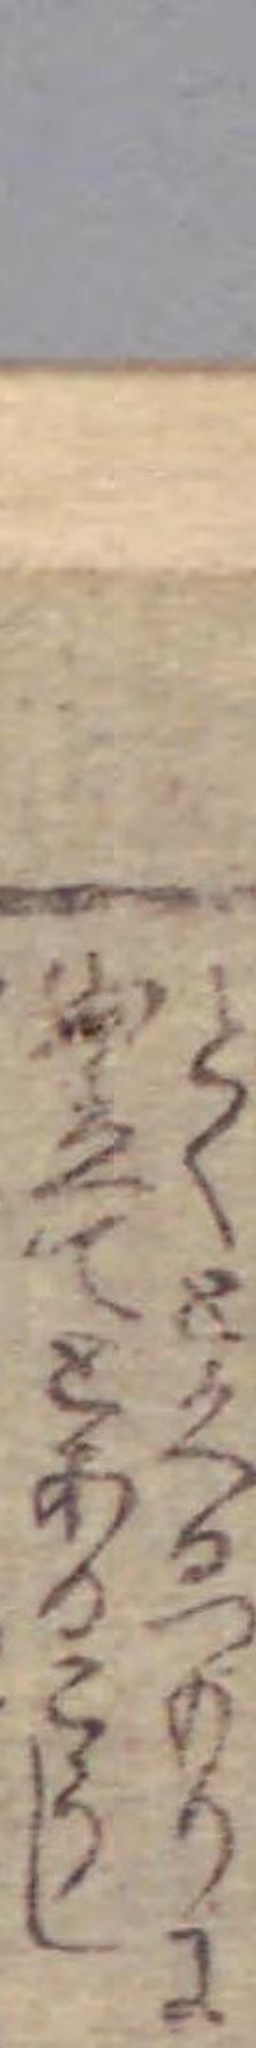出立てとあるこうし
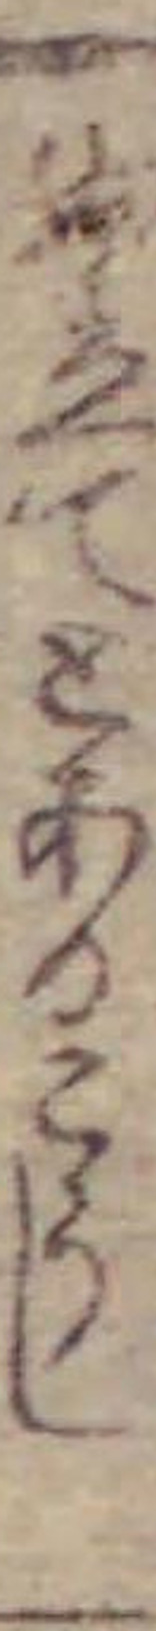出立てとあるこうし
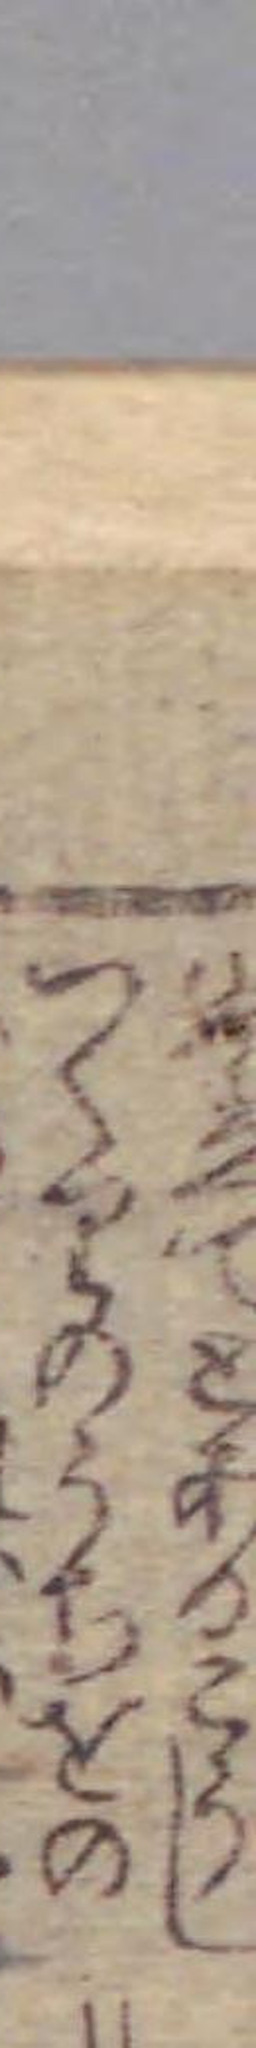つくりのうちをの
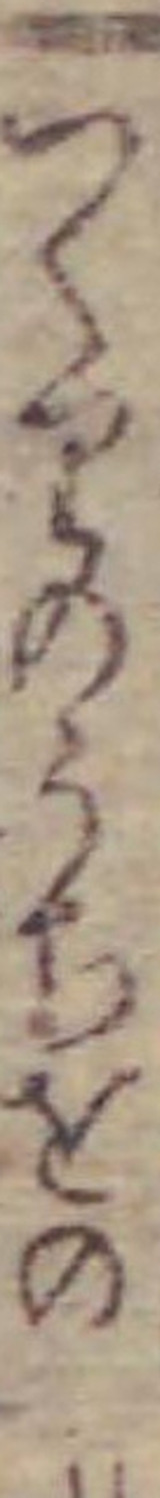つくりのうちをの
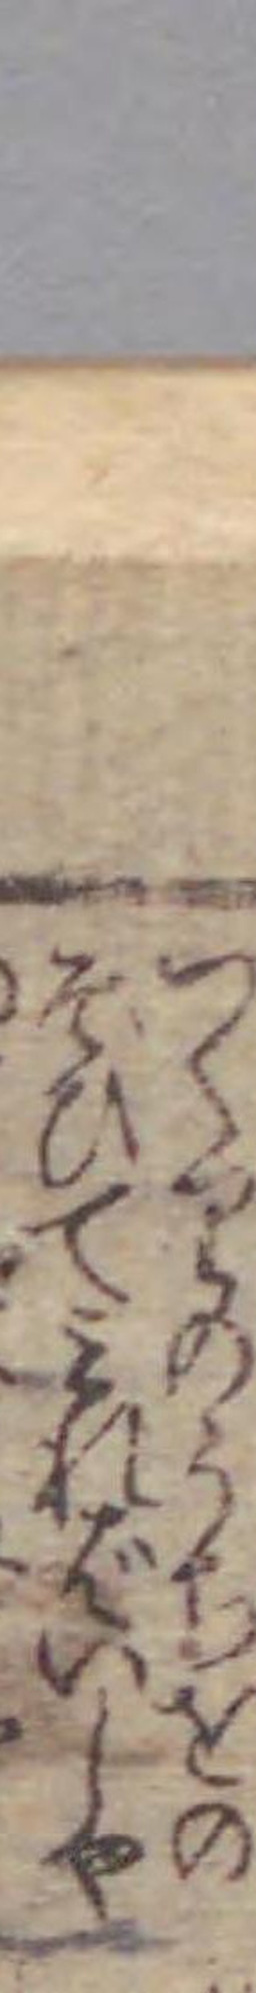ぞひてみればいしや
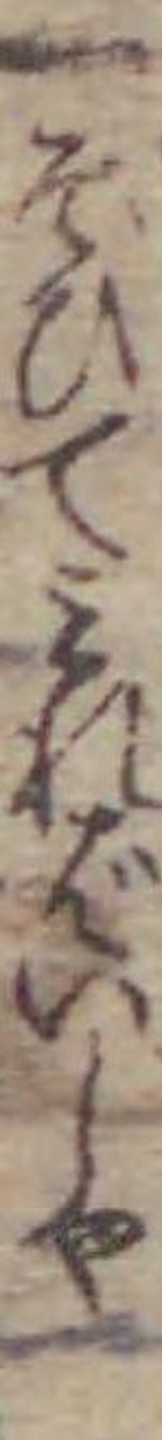ぞひてみればいしや
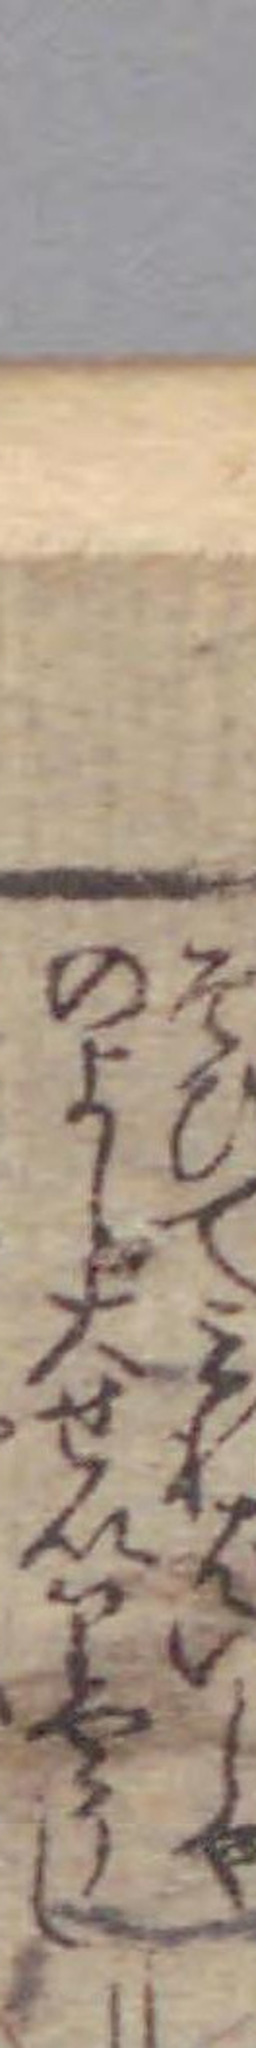のよし大せいりやう
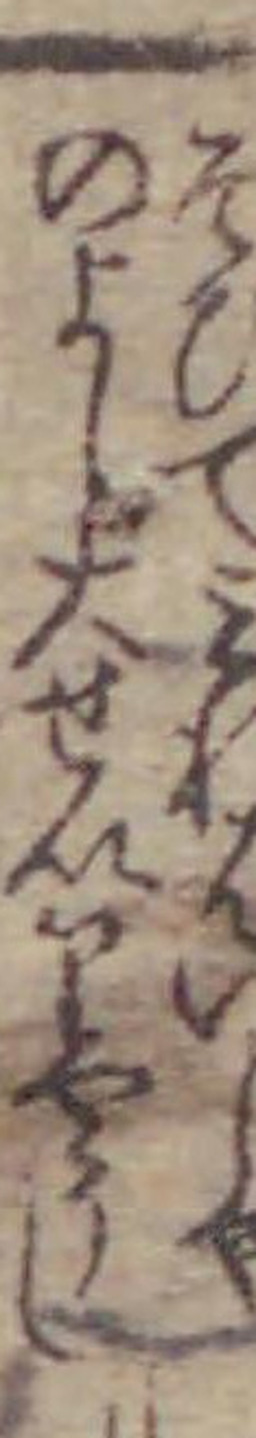のよし大せいりやう
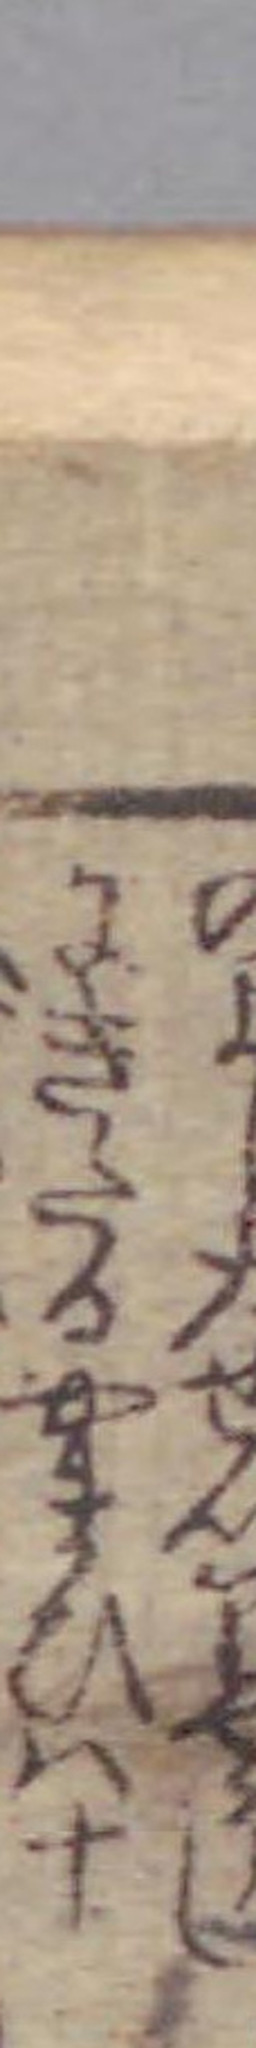にきたるやまひは十
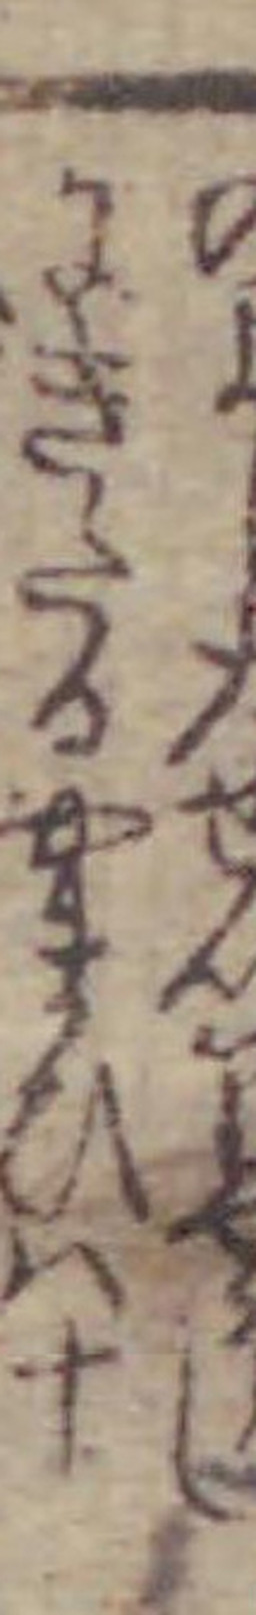にきたるやまひは十
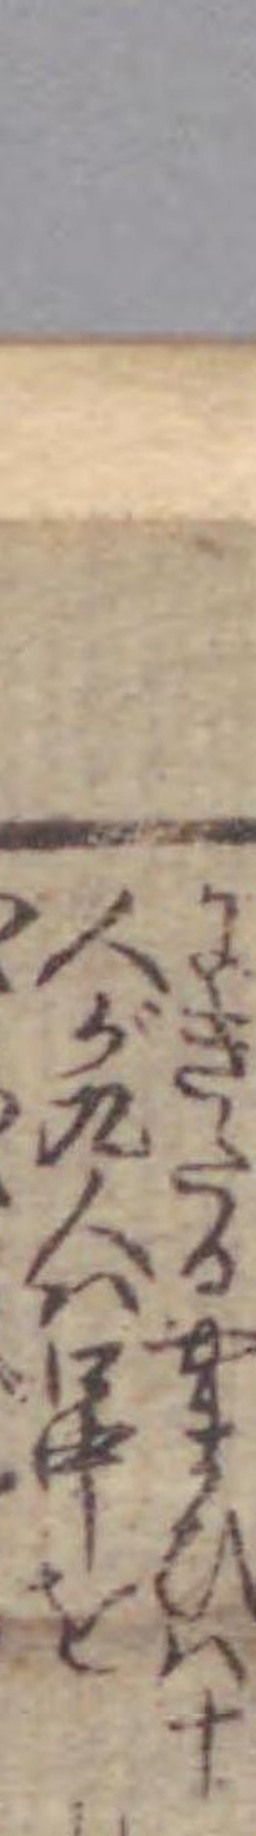人が九人は口中を
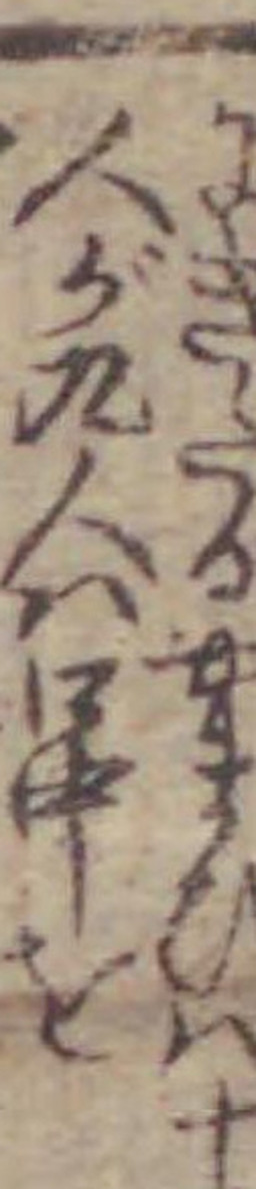人が九人は口中を
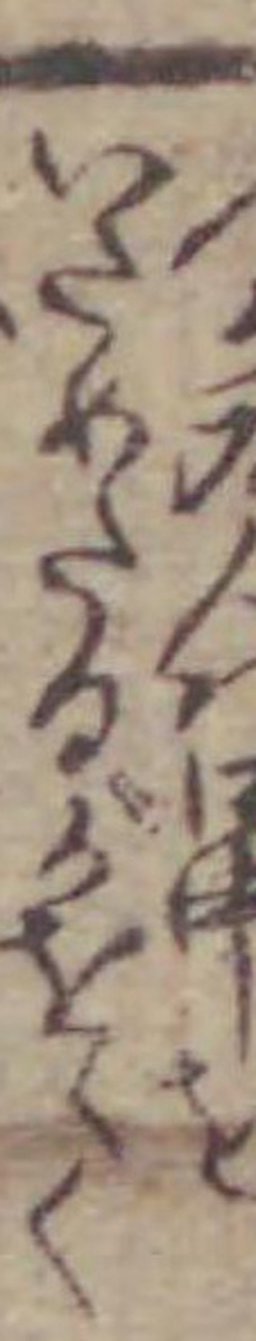いためたるかをゝく
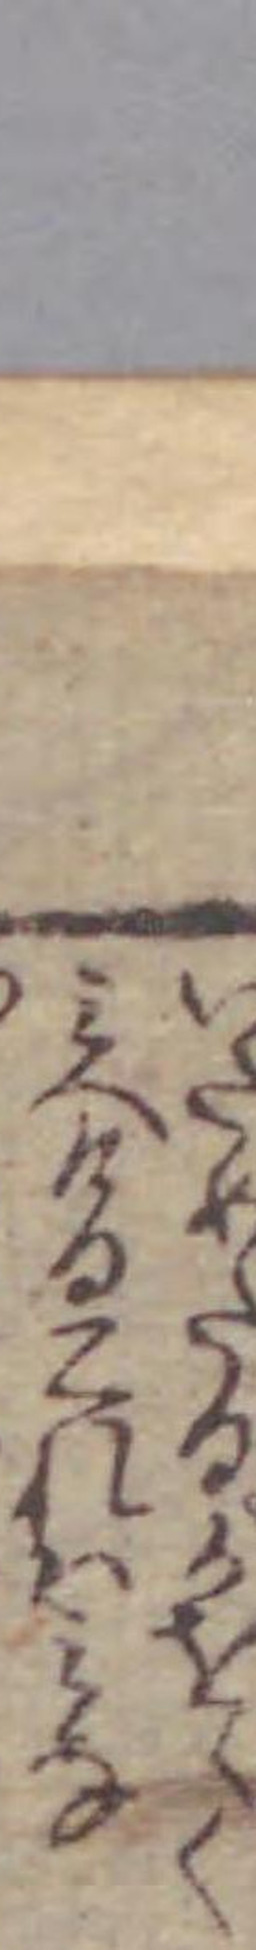みへけるこれはみな
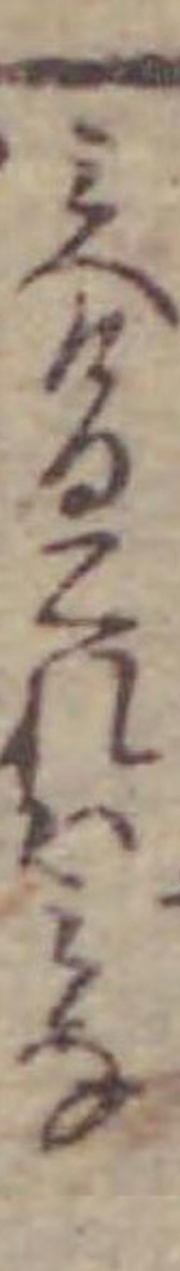みへけるこれはみな
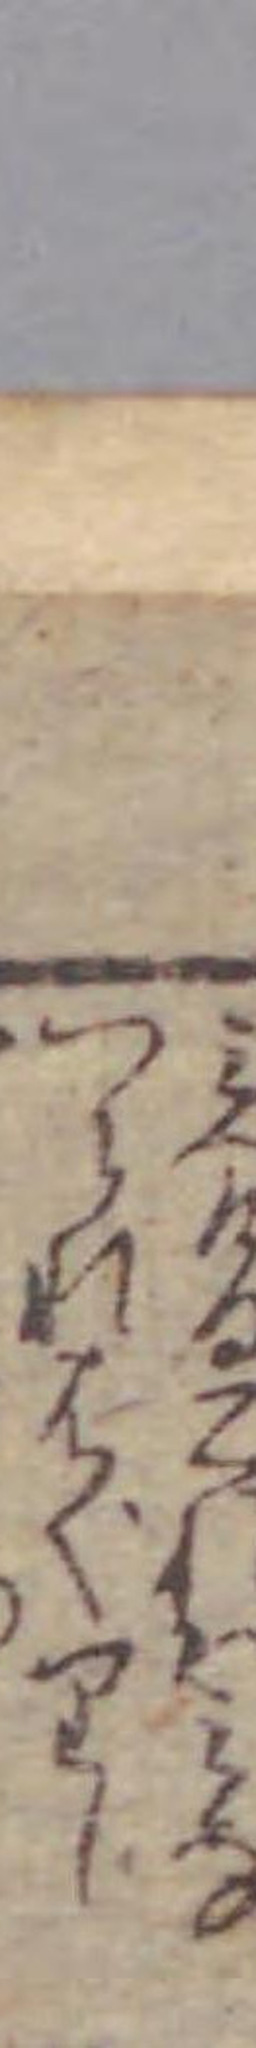つられはぐりし
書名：即席耳学問 : 3巻
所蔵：国立国会図書館 National Diet Library, JAPAN
